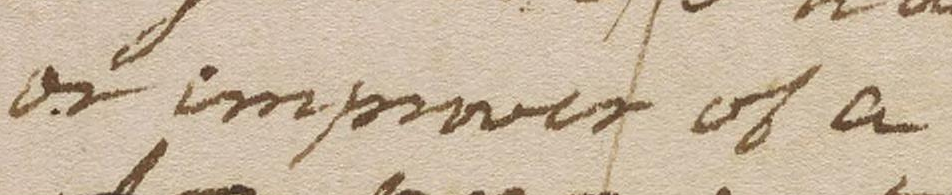or improver of a
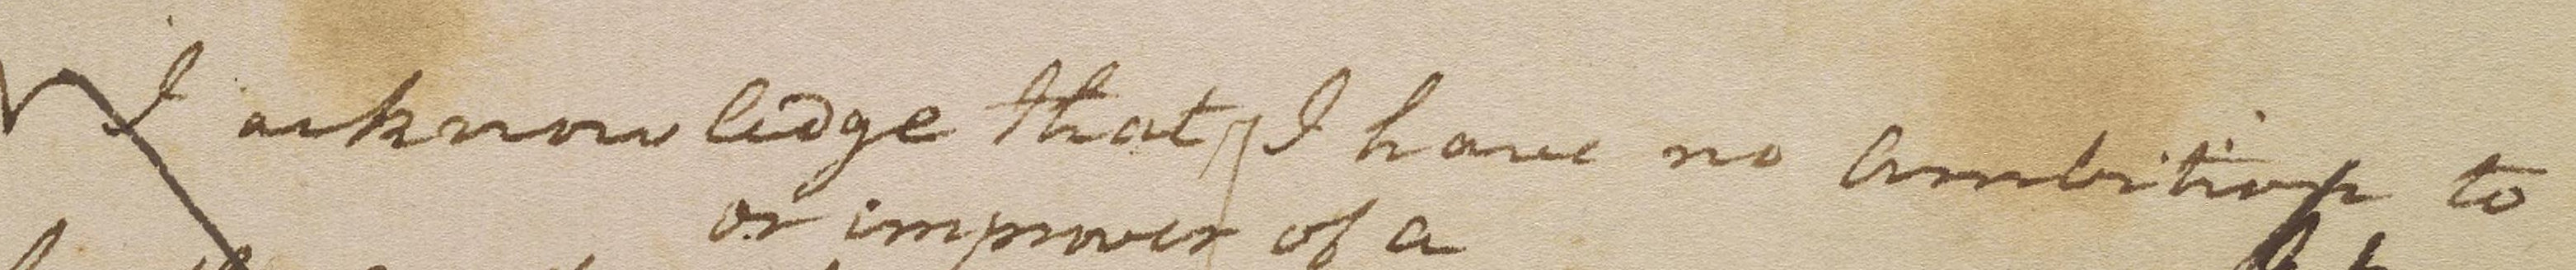I acknowledge that I have no ambition to
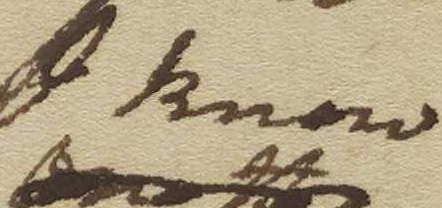I know
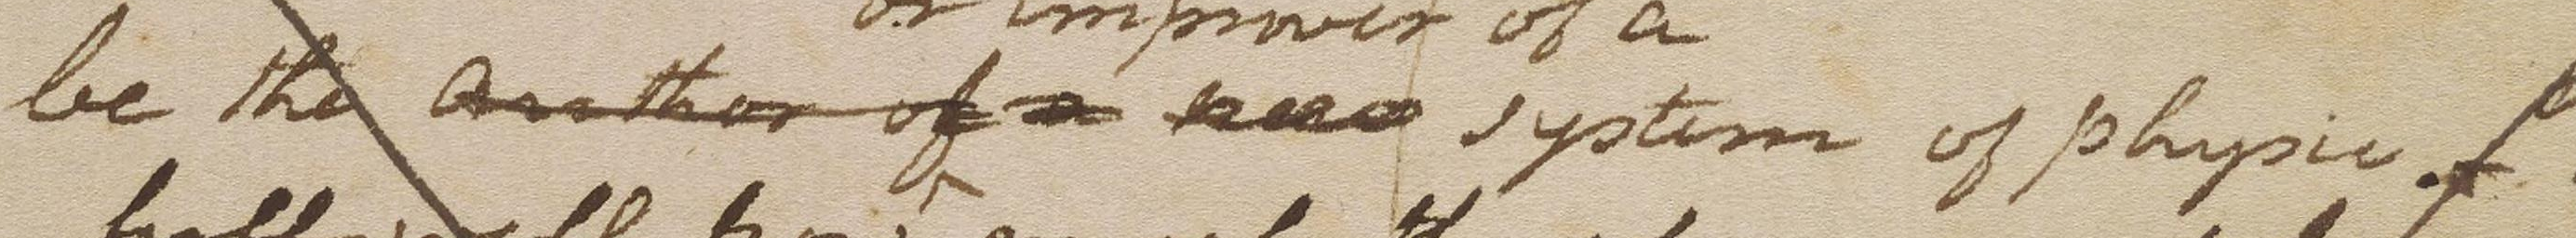be the author [of] [a] [new] a system of physic.
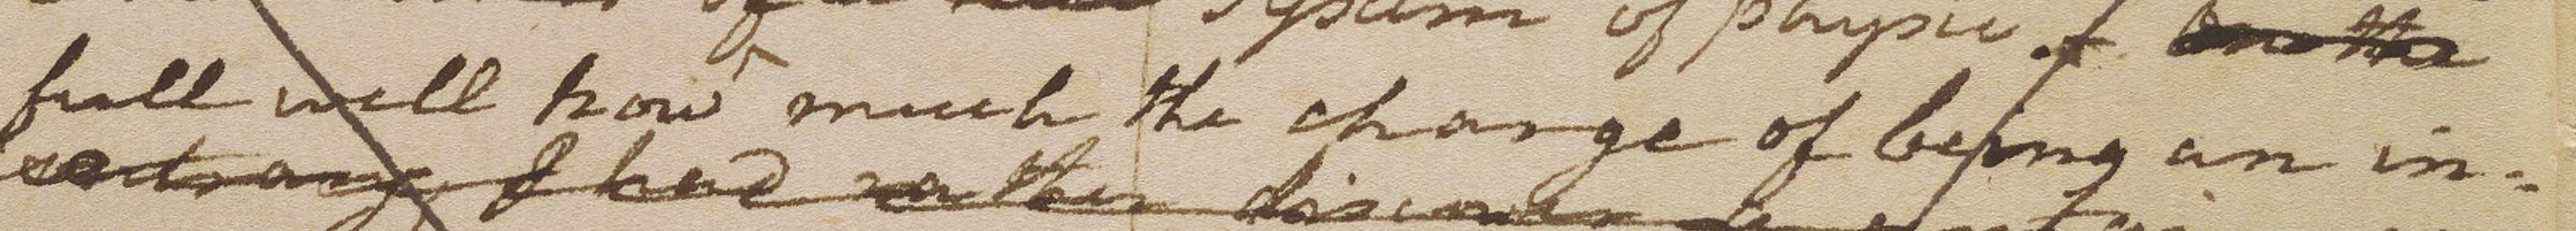full well how much the charge of being an in-
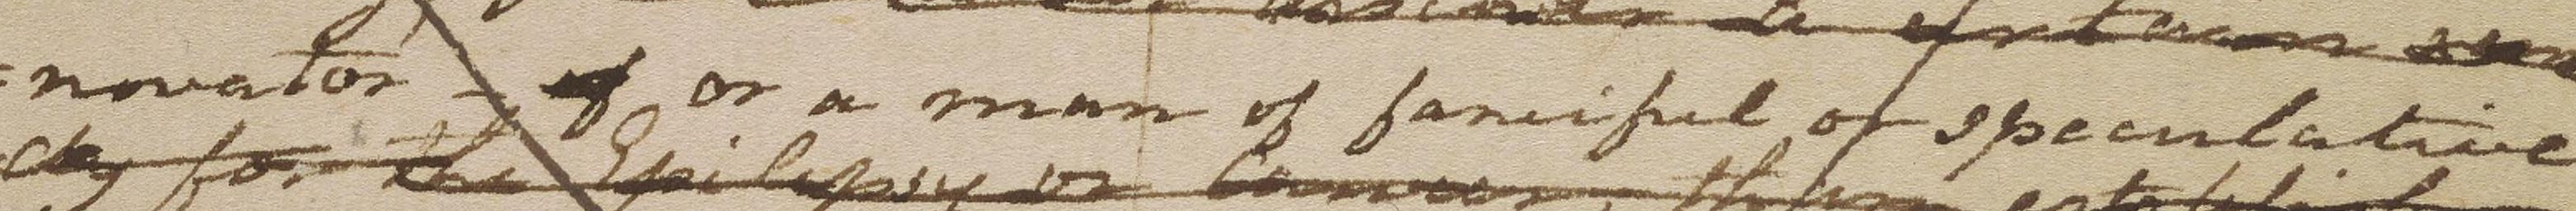-novator or a man of fanciful or speculative
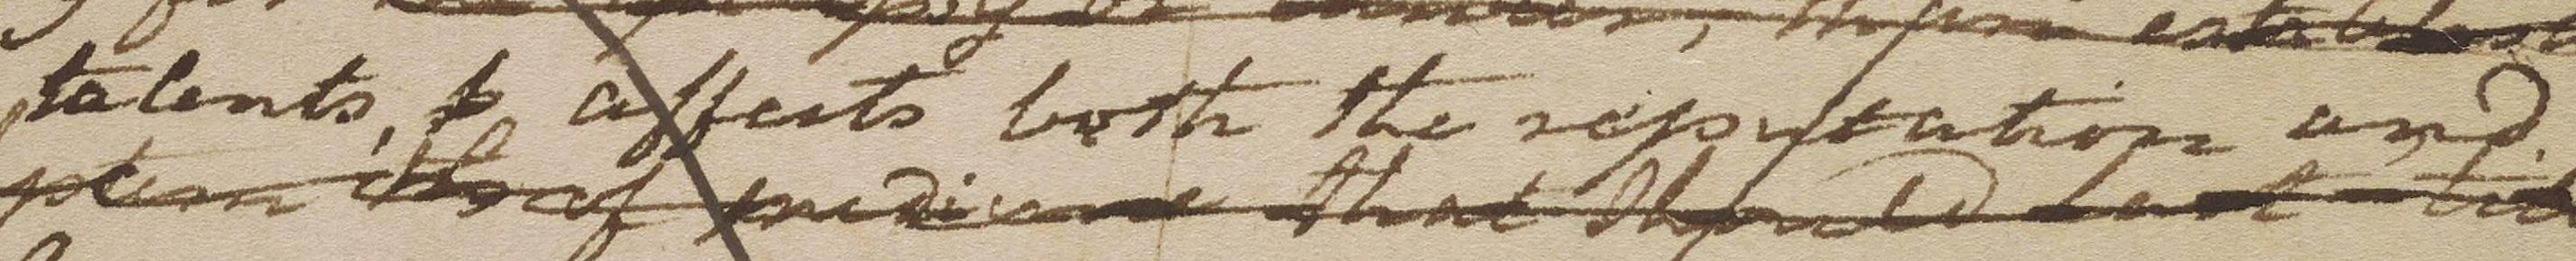talents & affects both the reputation and
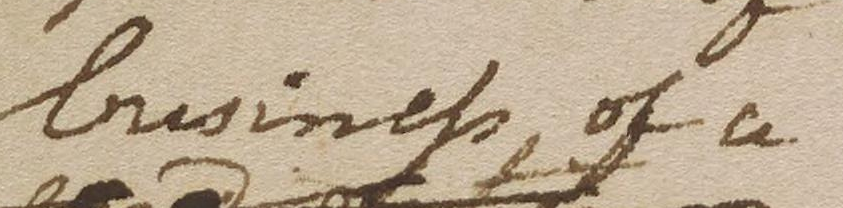business of a
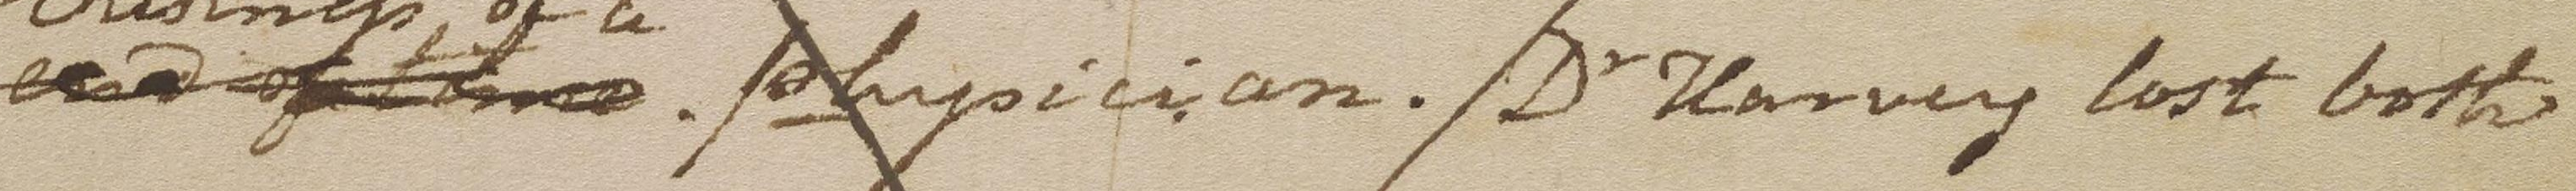[and of time] physician. D^r Harvey lost both
